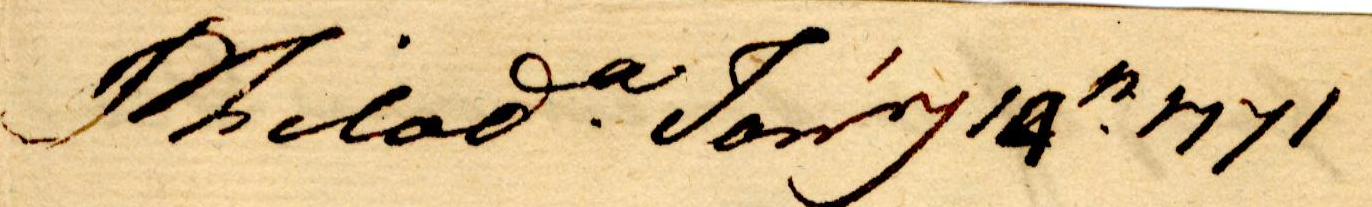Philad^a Jan'y 14^th 1771
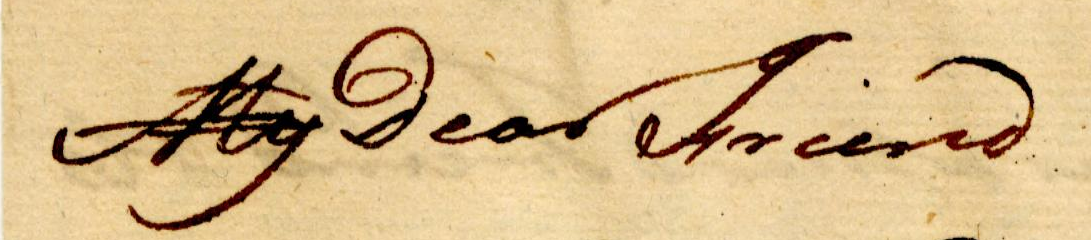[My] Dear Friend
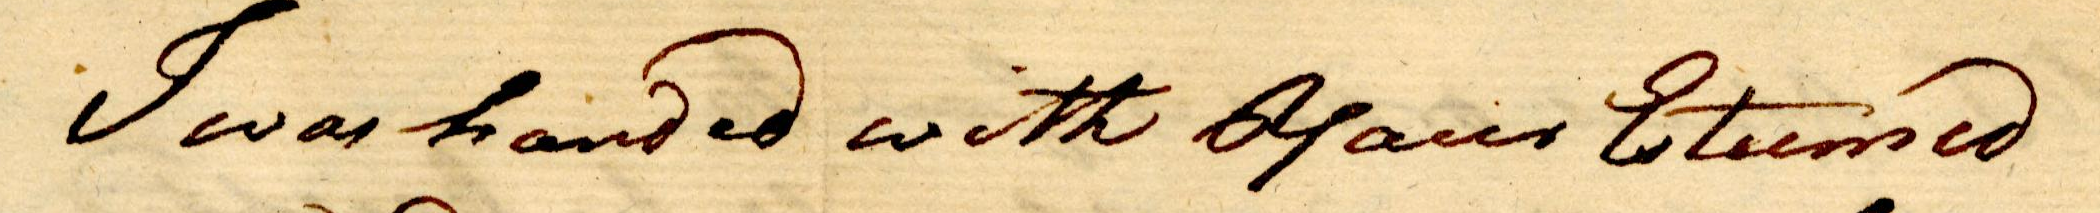I was handed with Your Esteemed
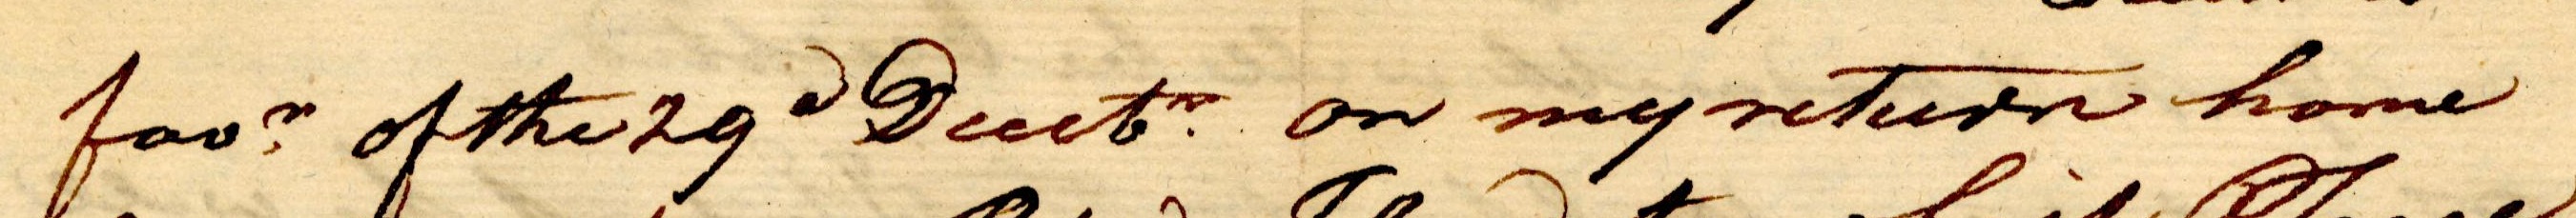fav^r of the 29^t Deceb^r. on my return home
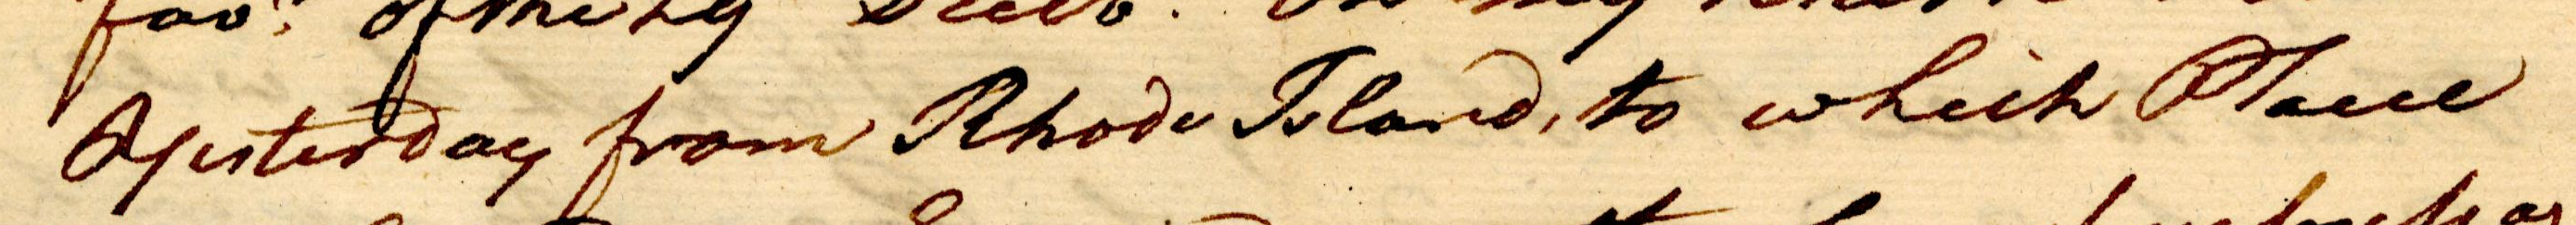Yesterday from Rhode Island, to which Placce
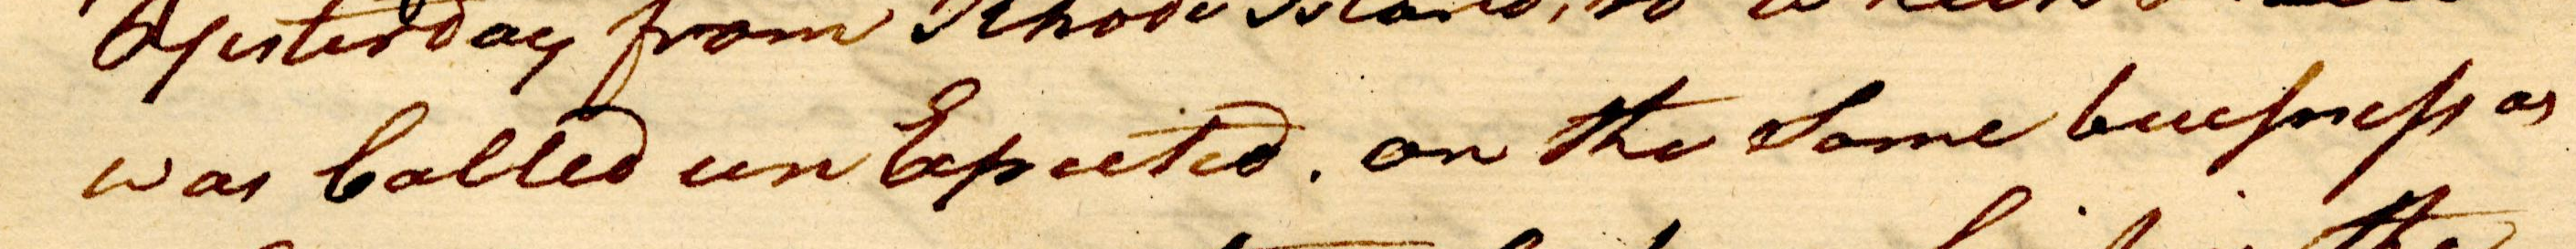was Called un Expected on the same buisness as
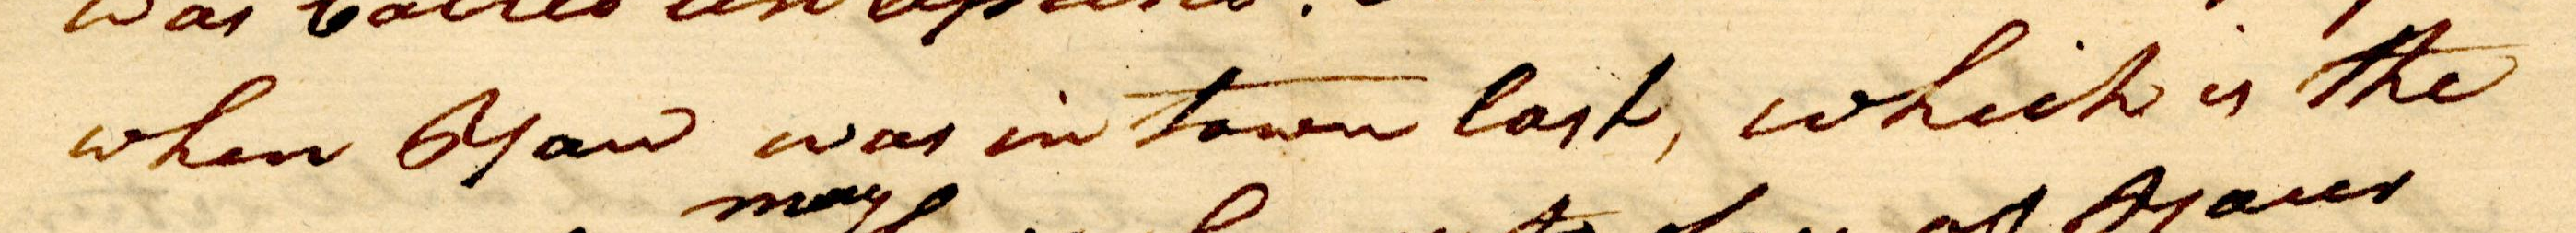when You was in town last, which is the
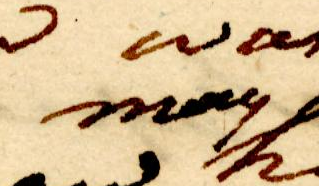may
